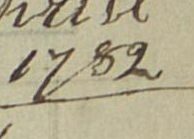1782
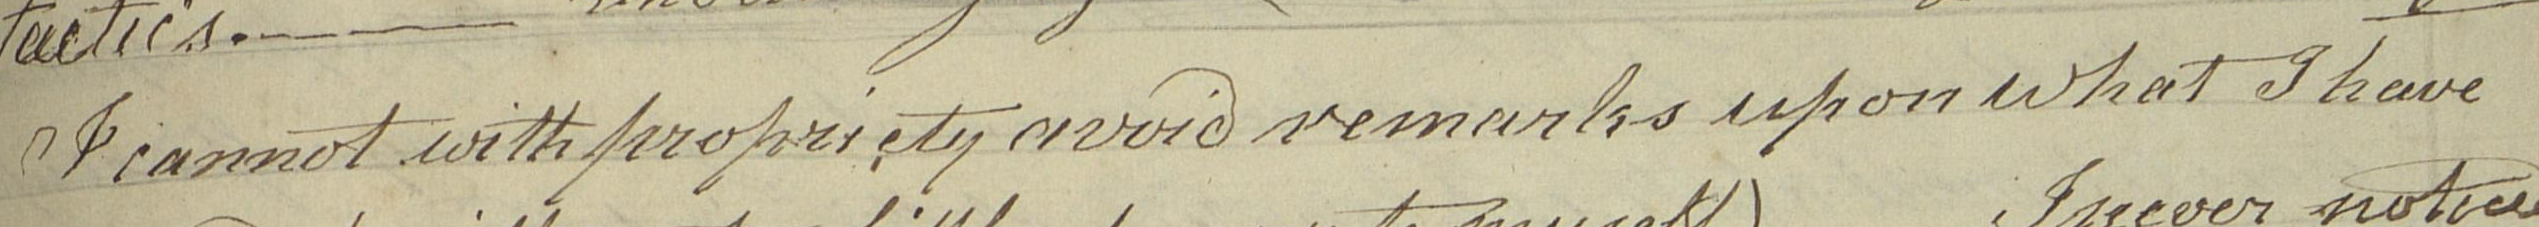I cannot with propriety avoid remarks upon what I have
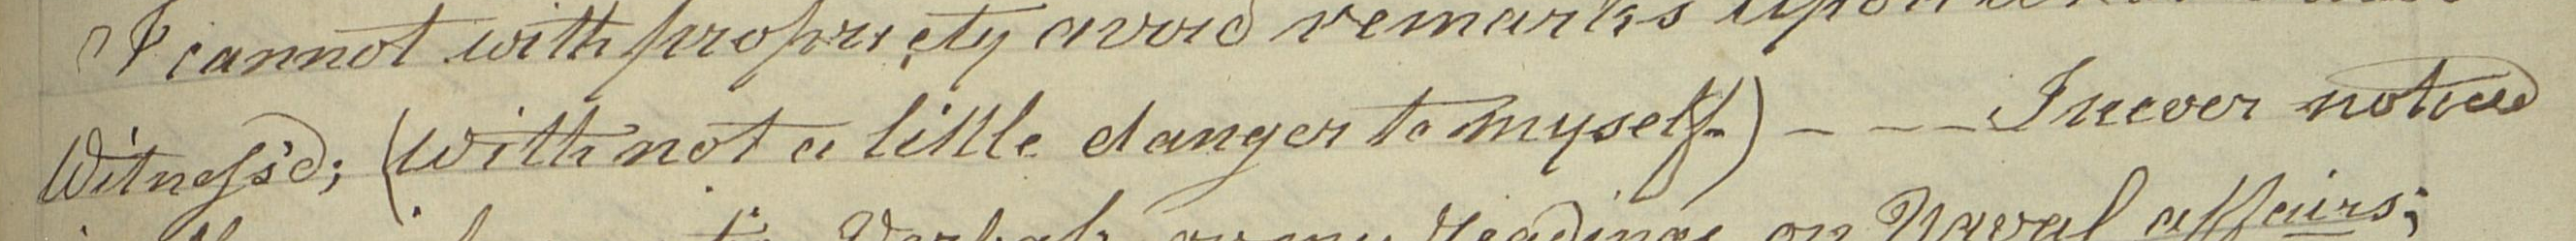Witness'd; (With not a little danger to myself.) I never noticed
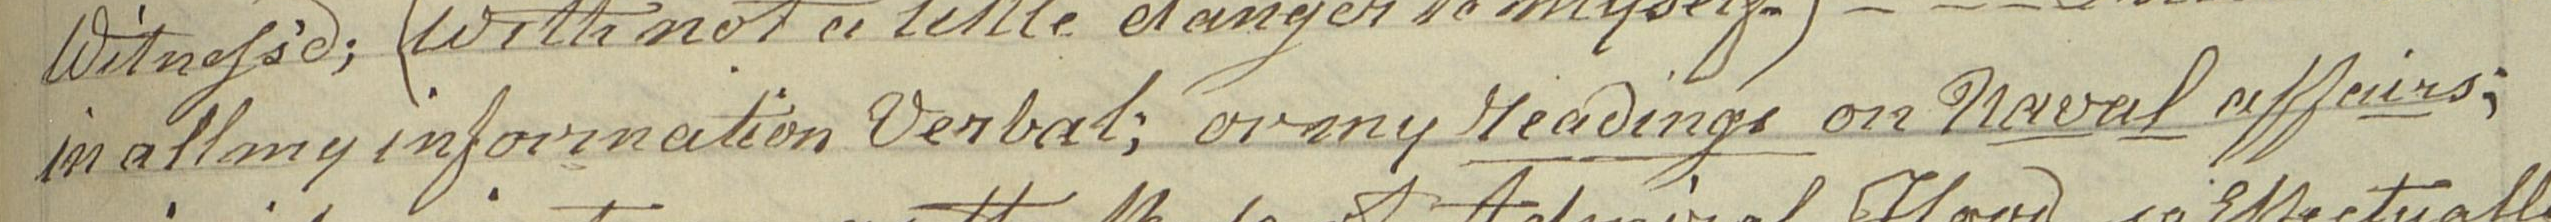in all my information Verbal; or my Readings on Naval affairs;
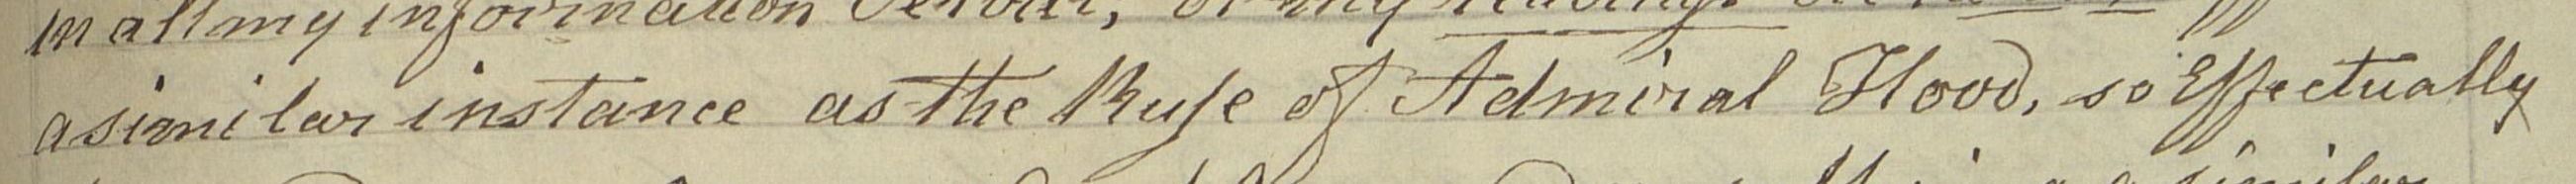a similar instance as the Ruse of Admiral Hood, so effectually
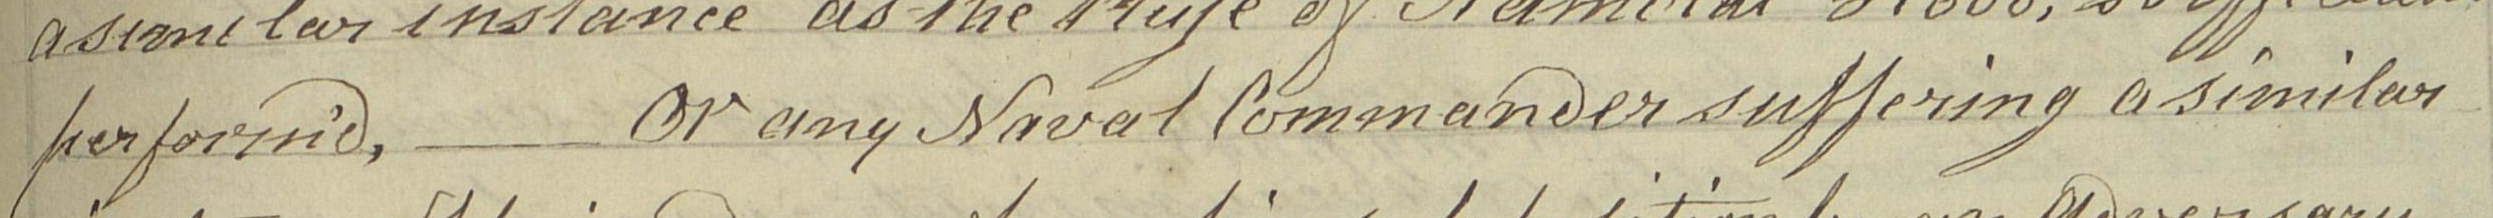perform'd, or any Naval Commander suffering a similar
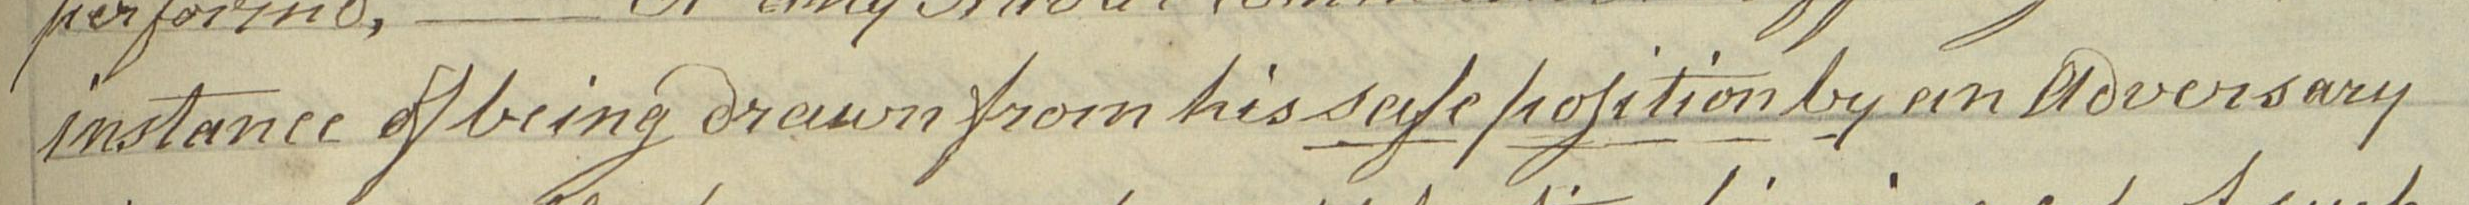instance of being drawn from his safe position by an Adversary
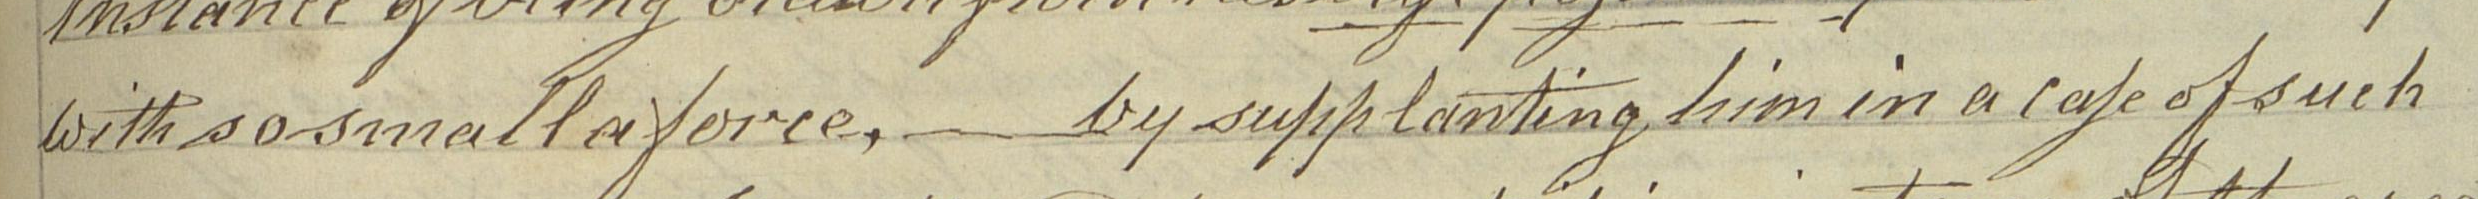with so small a force, by supplanting him in a case of such
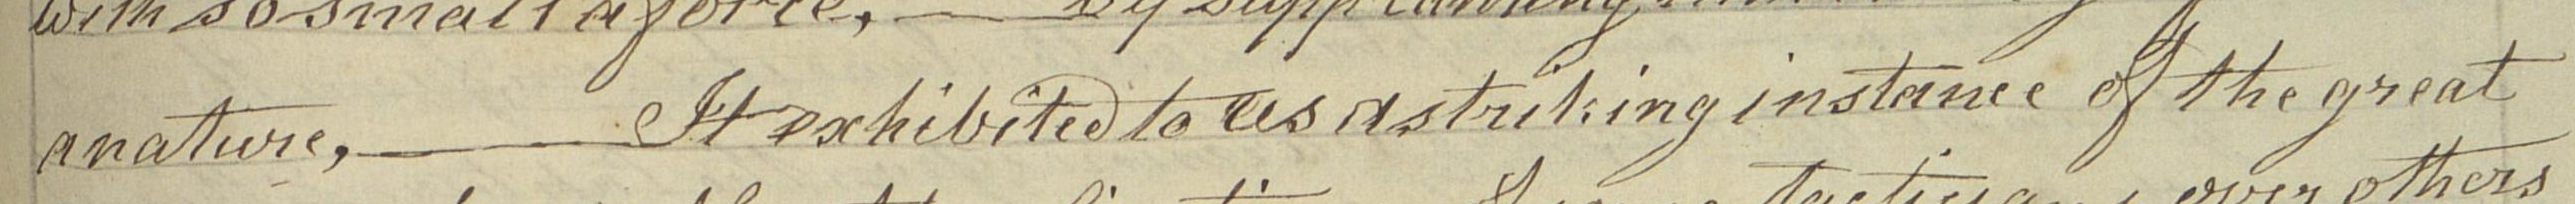a nature, It exhibited to us astriking instance of the great
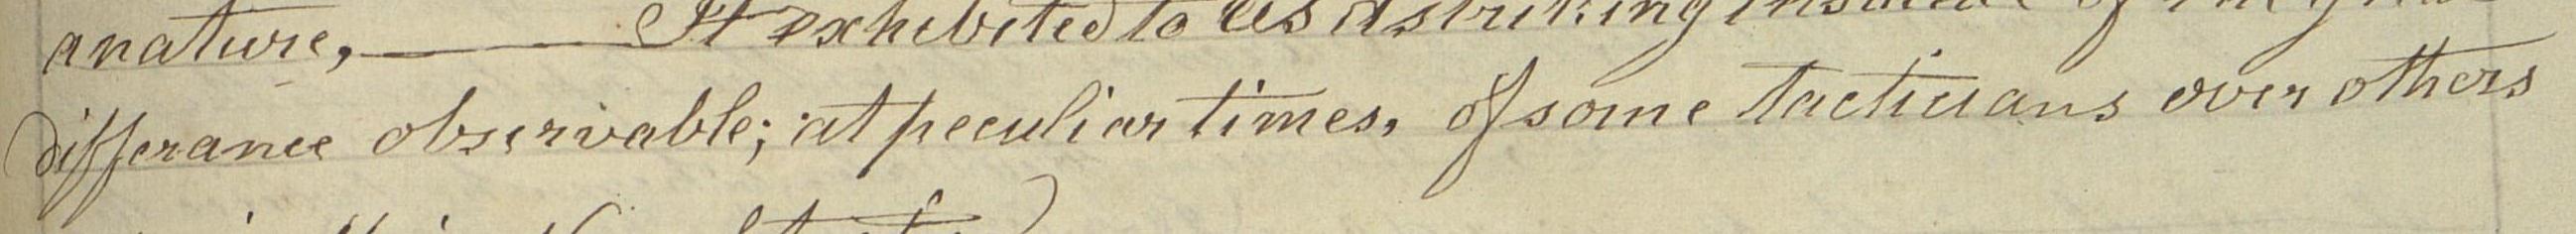differance observable; at peculiar times. of some tacticiains over others
